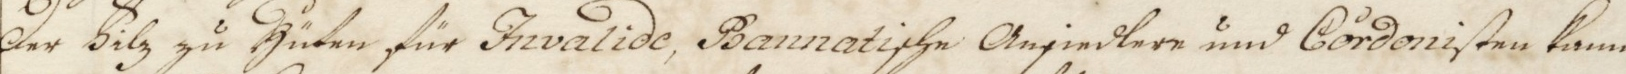Der Filz zu Hüten für Invalide, Bannatische Ansiedlere und Cordonisten kann
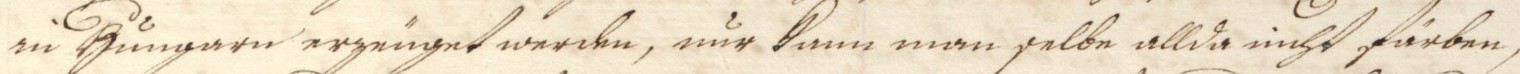in Hungarn erzeüget werden, nur kann man selbe allda nicht färben,
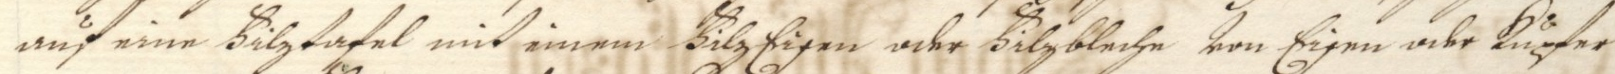auf eine Filztafel mit einem Filz Eisen oder Filzbleche von Eisen oder Kupfer
